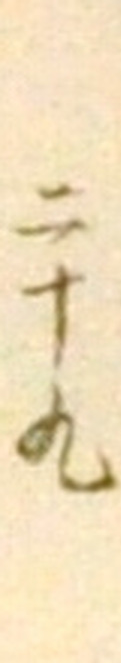二十九

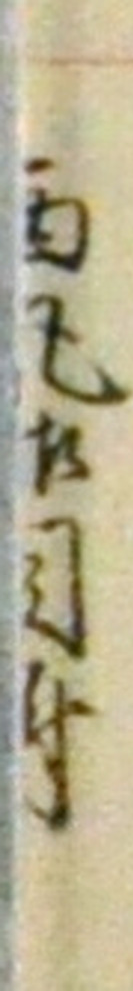西丸御目付
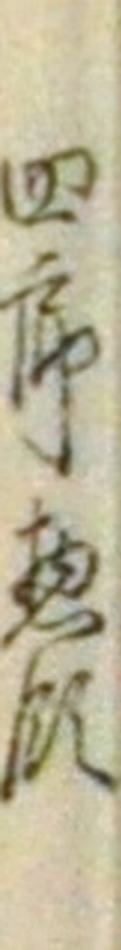四郎惣領
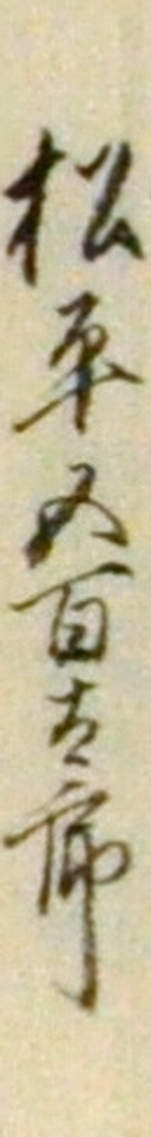松平五百太郎
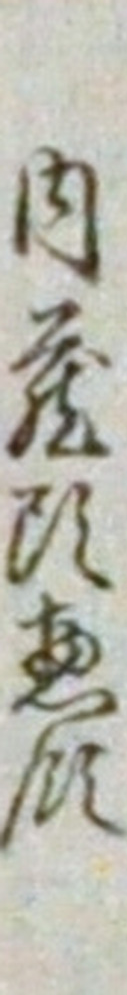内蔵頭惣領
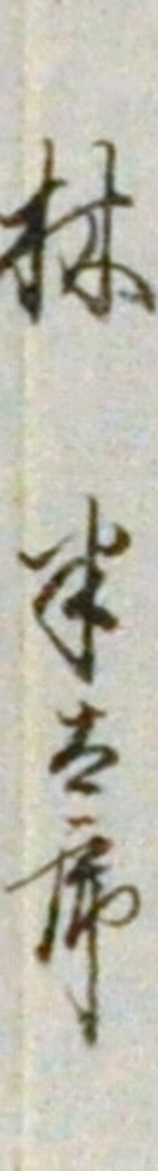林半太郎
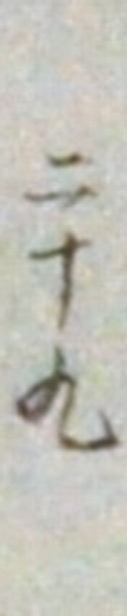二十九
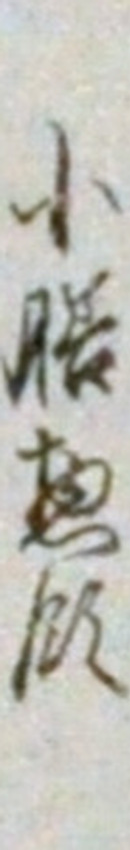小膳惣領
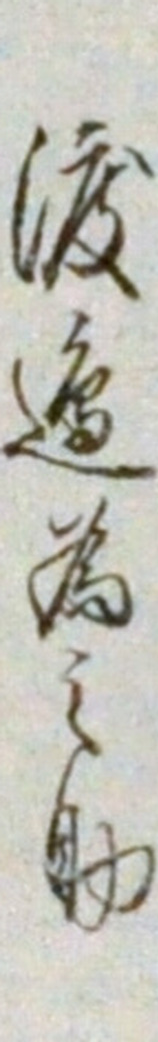渡辺為之助
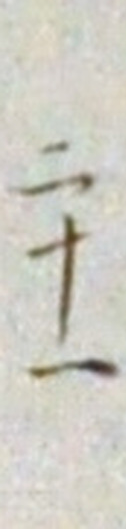二十一
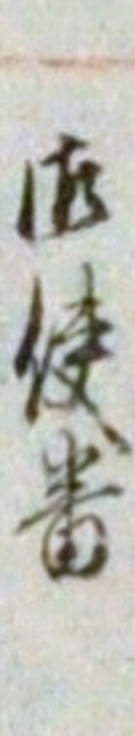御使番
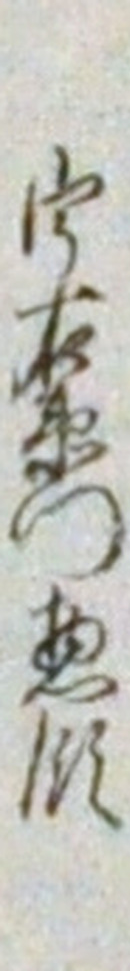宇右衛門惣領
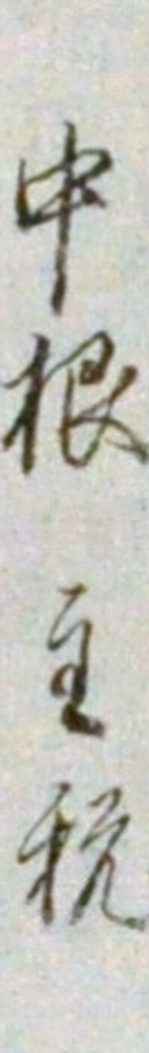中根主税
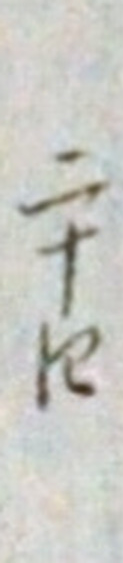二十四
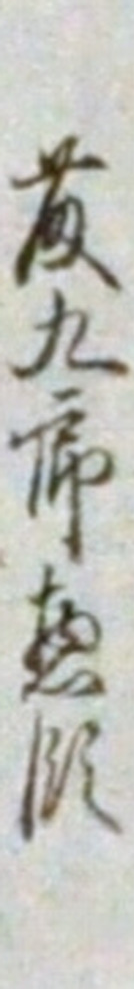籐九郎惣領
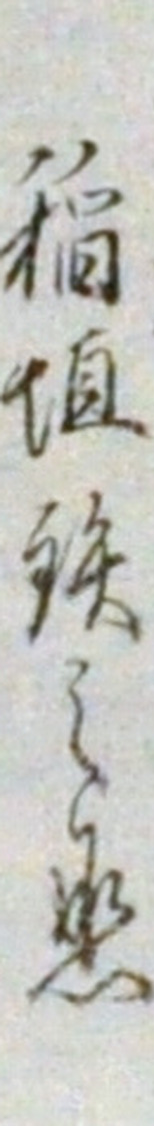稲垣鉄之丞
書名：若年寄御役中之御書物〔一括〕
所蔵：伊那市立高遠町図書館・合同会社AMANE
